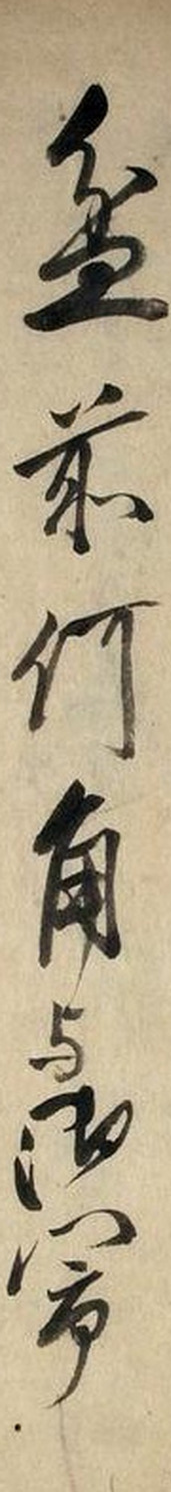盆前何角と御鬧
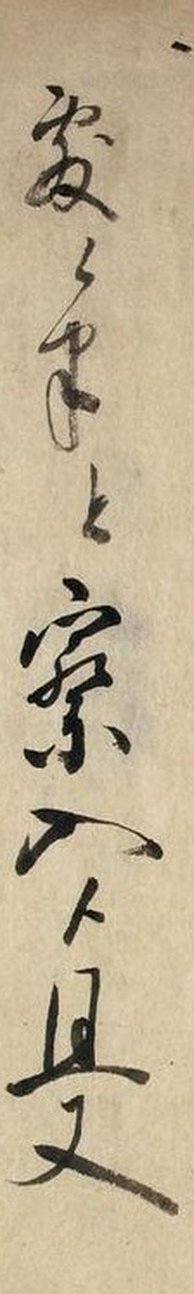敷候半と察入候且又
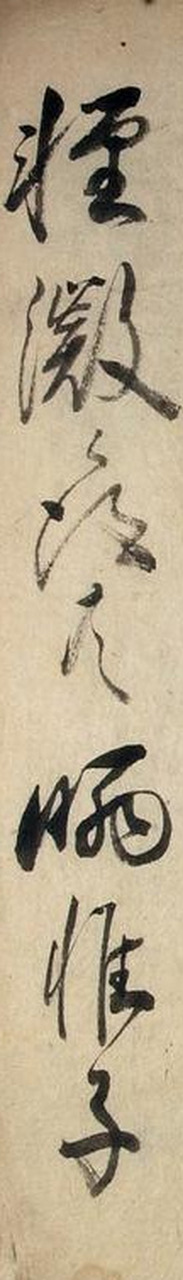軽微候得共晒帷子

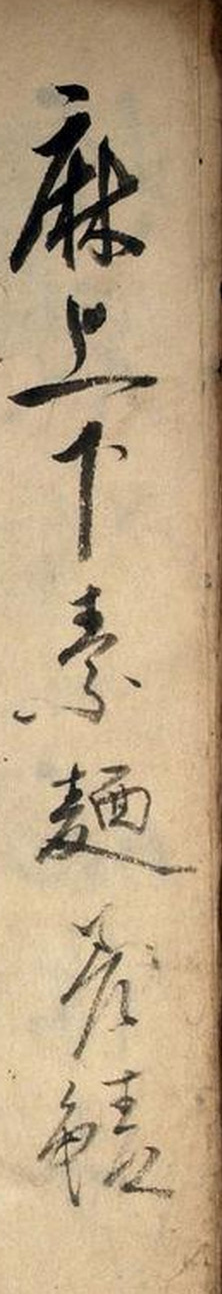麻上下素麺差鯖
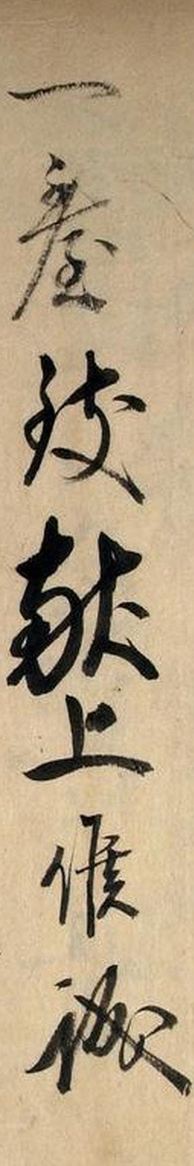一台致献上候誠
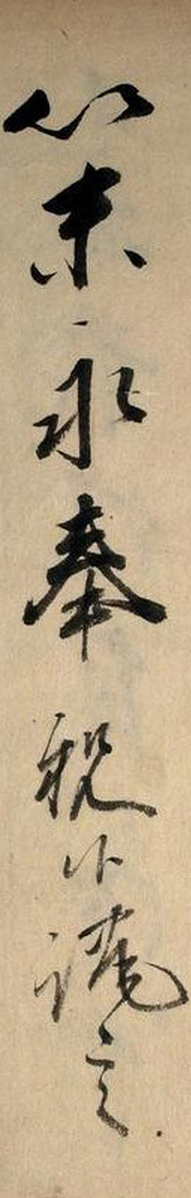以末永奉祝候謹言
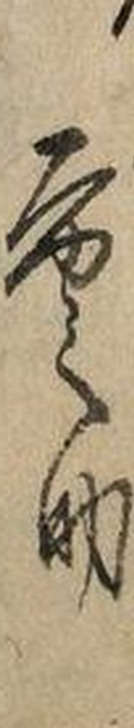市之助
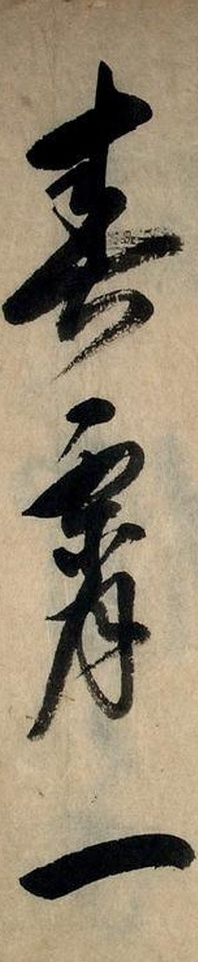春宵一

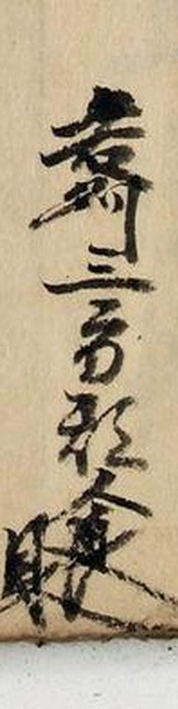若州三方郡食見
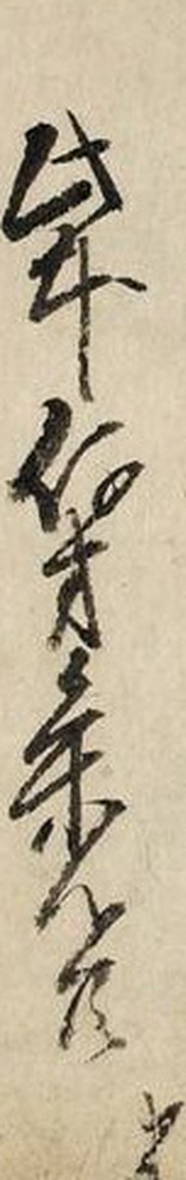此本何方参候共
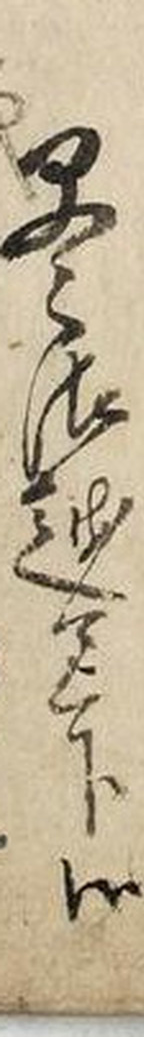早々御越可返下候
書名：御手本（手習、消息文、和漢朗詠集・論語の一節）
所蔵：福井県文書館 Fukui Prefectural Archives
